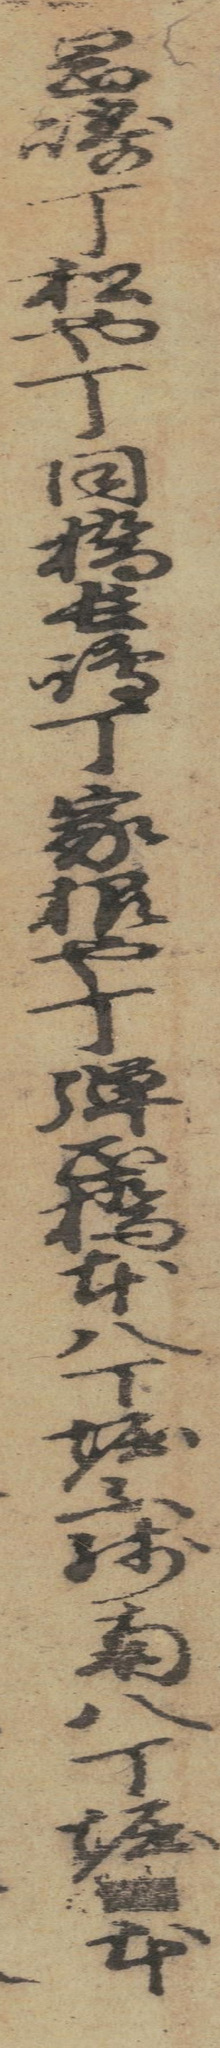岡崎丁松や丁同橋長嶋丁家根や丁弾正橋本八丁堀不残南八丁堀本
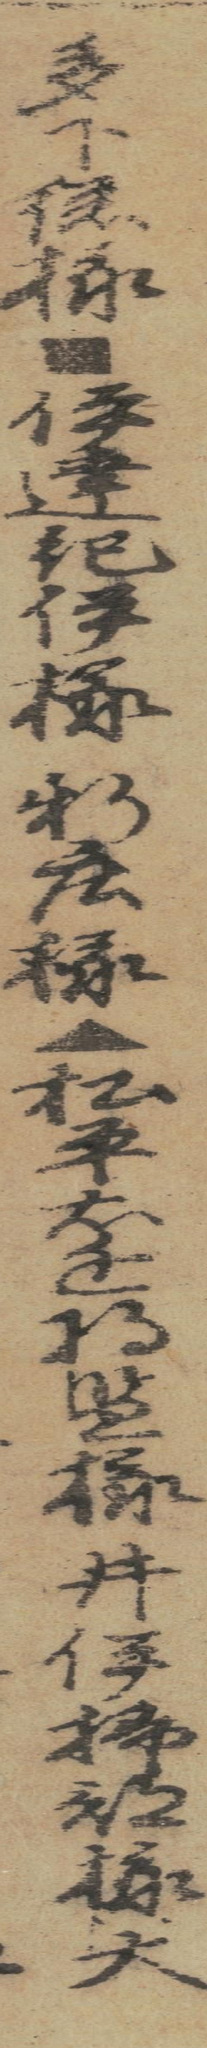多下総様伊達紀伊様新庄様▲松平右近将監様井伊掃部様大
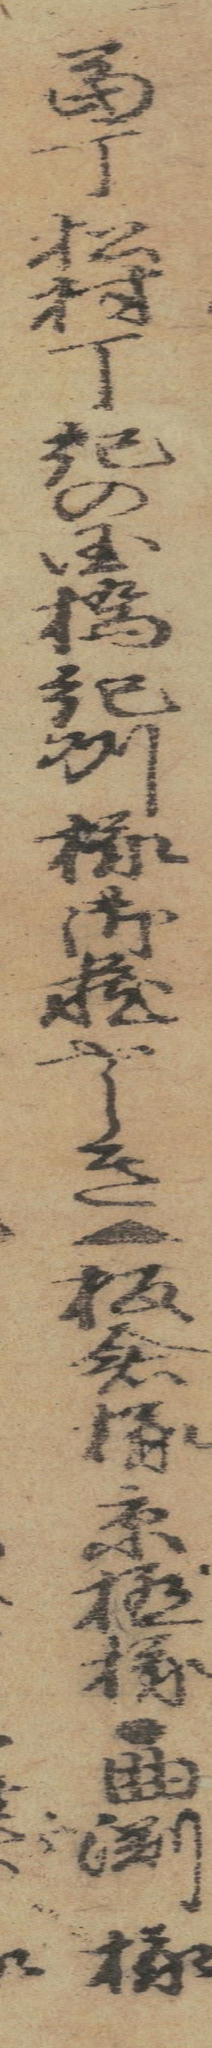当丁松村丁紀の国橋紀州様御蔵やしき▲板倉様京極様●曲渕様
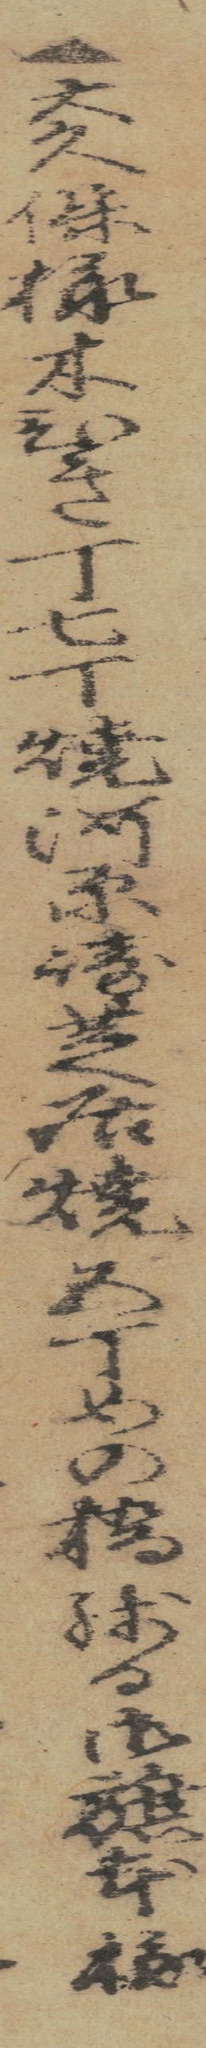▲大久保様木ひき丁七丁焼河原崎芝居焼五丁めの橋残る御旗本様
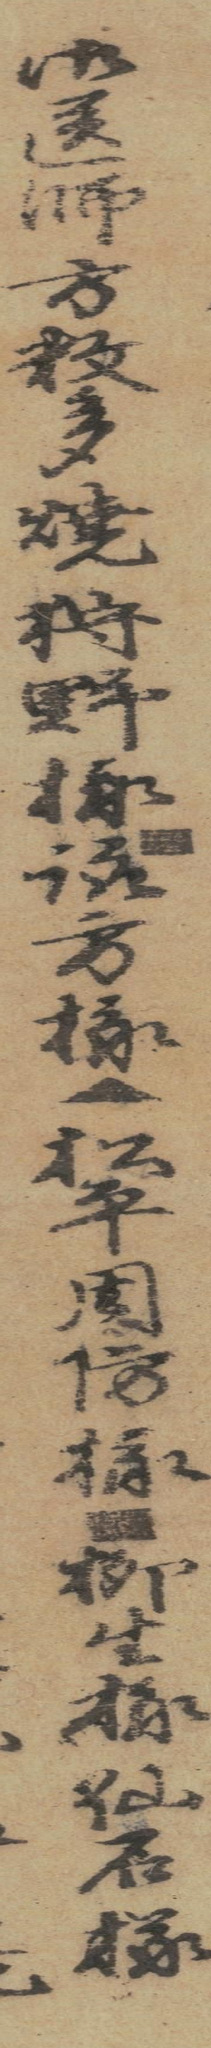御医師方数多焼狩野様諏方様▲松平周防様柳生様仙石様
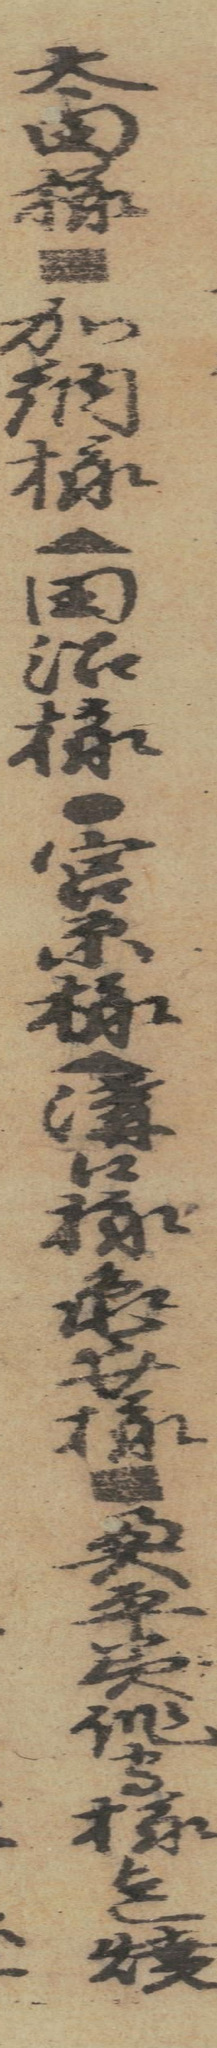太田様加納様▲国治様●宮原様▲溝口様亀せ様奥平美作守様迄焼
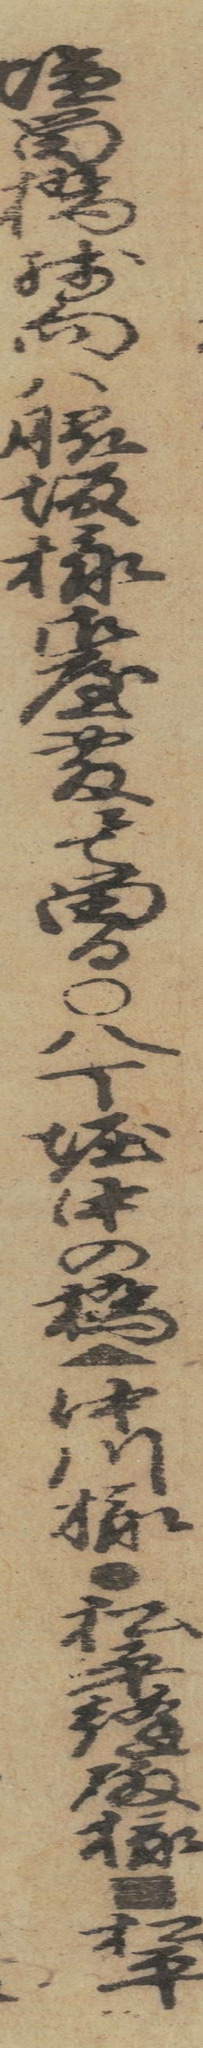塩留橋残向は脇坂様御屋敷にて留る◯八丁堀中の橋▲中川様●松平讃岐様松平
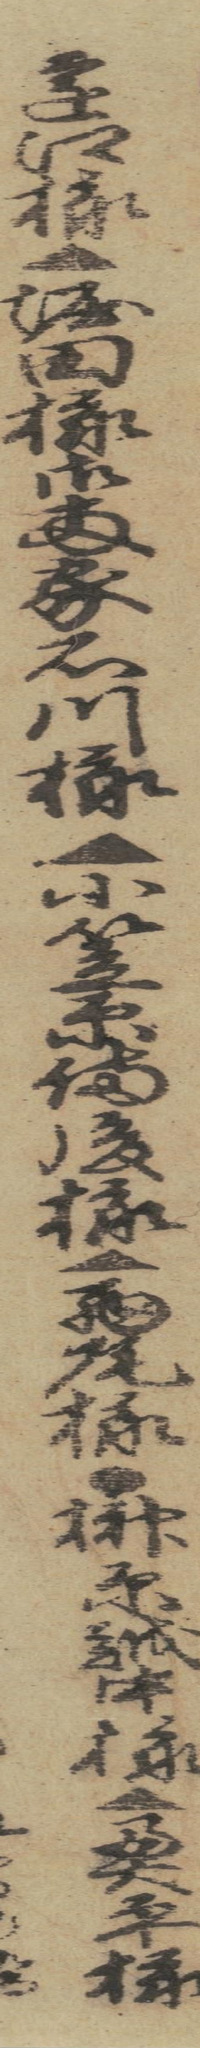遠江様▲堀田様御兩家石川様▲小笠原備後様▲西尾様●榊原越中様▲奥平様
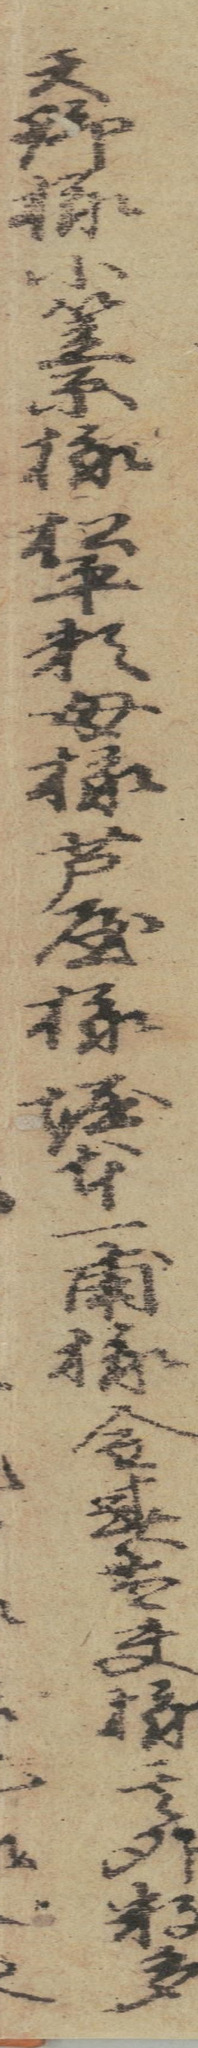天野様小笠原様松平頼母様芦屋様堀本一甫様金森太夫様其外数多
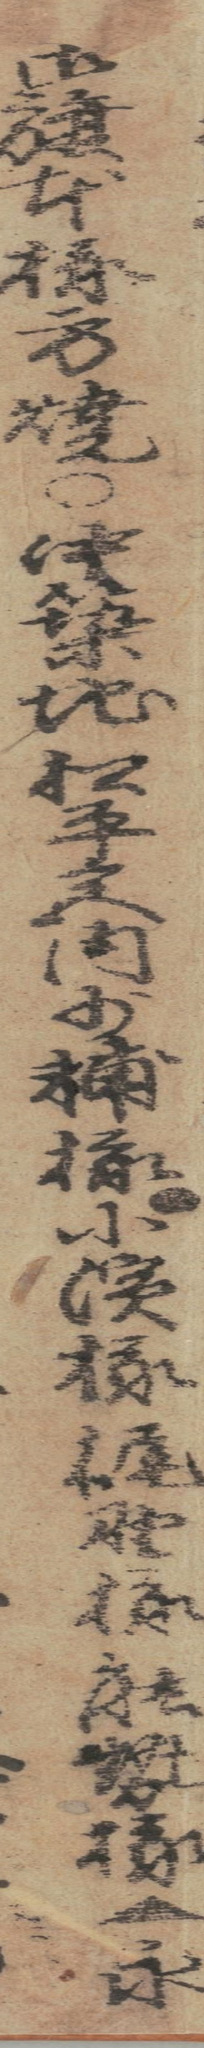御旗本様方焼◯潰築地松平宮内少輔様◯小浜様梶野様能勢様▲永
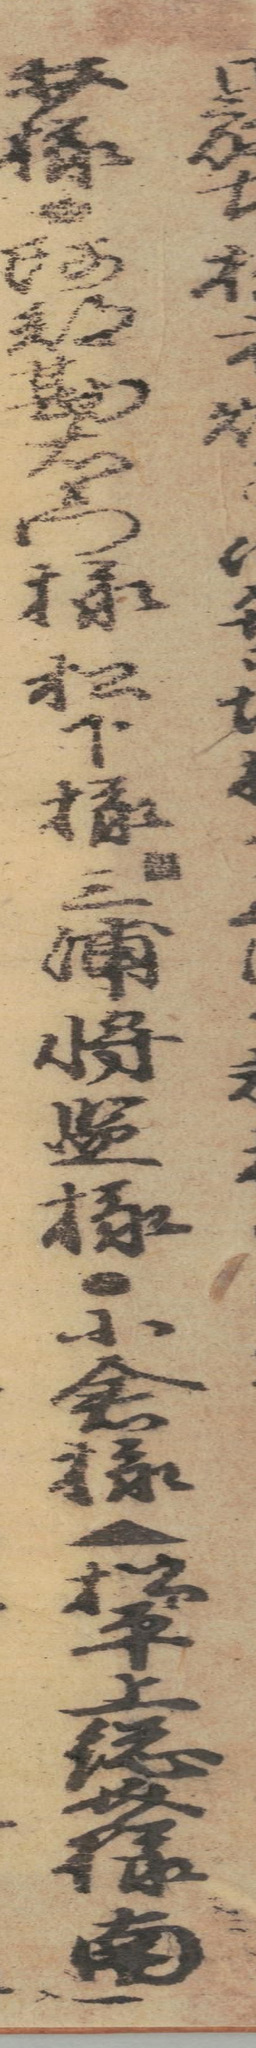井様●阿部勘右衛門様松下様三浦将監様●小倉様▲松平上総介様南
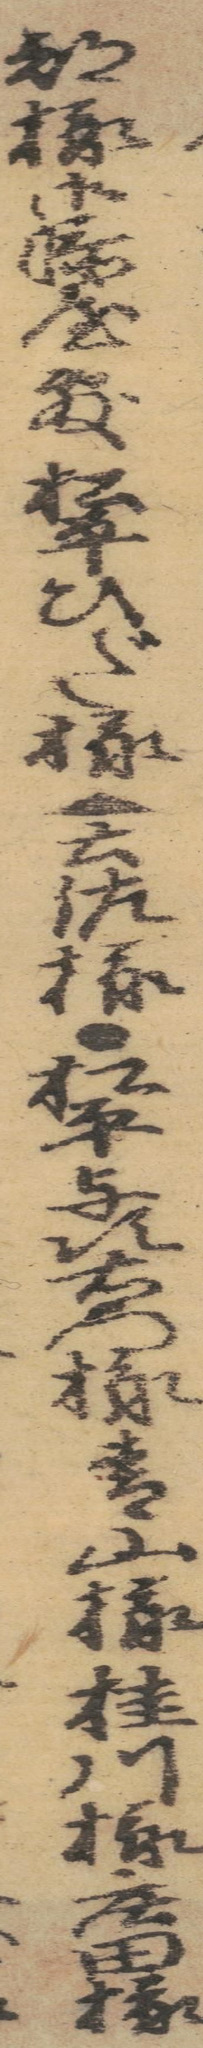部様御添屋敷松平ひだ様▲土佐様●松平与次右衛門様青山様桂川様●庄田様
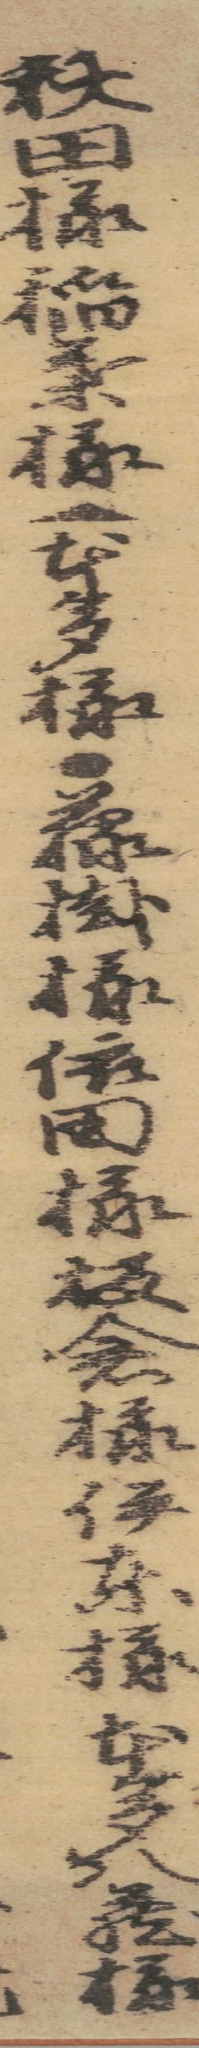秋田様稲葉様▲本多様●藤掛様依田様板倉様伊東様本多八蔵様
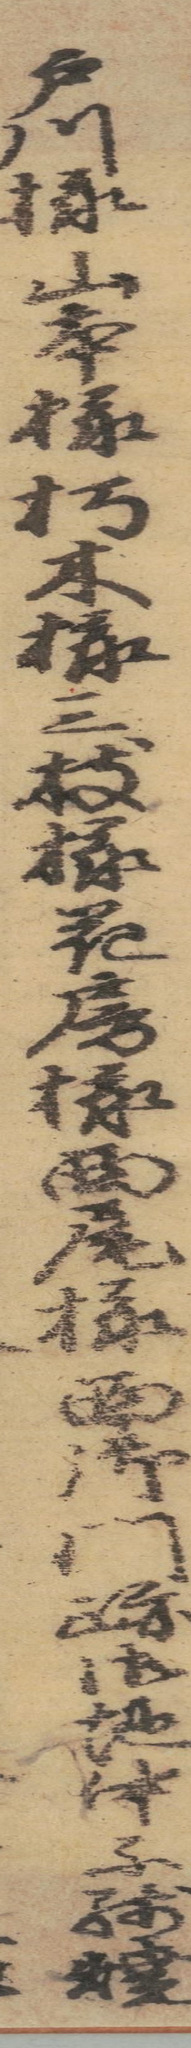戸川様山本様朽木様三枝様花房様西尾様西御門跡御地中不残焼
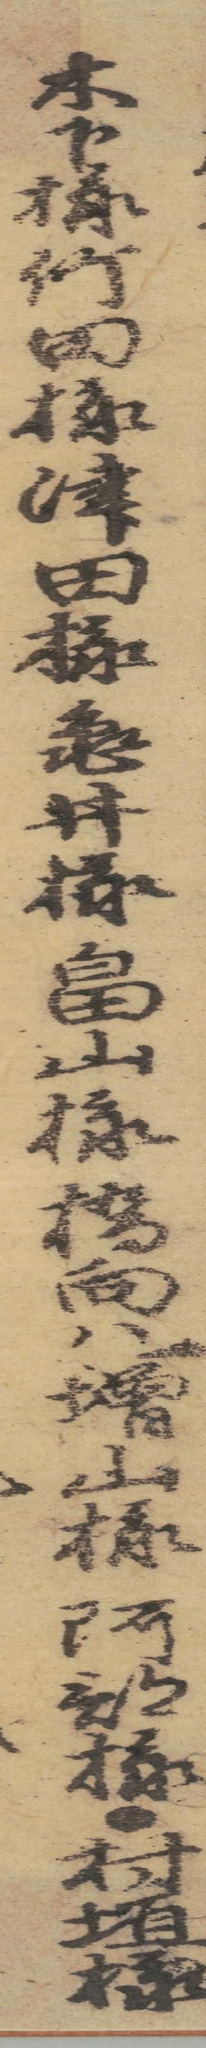木下様竹田様津田様亀井様畠山様橋向は▲増山様阿部様●村垣様
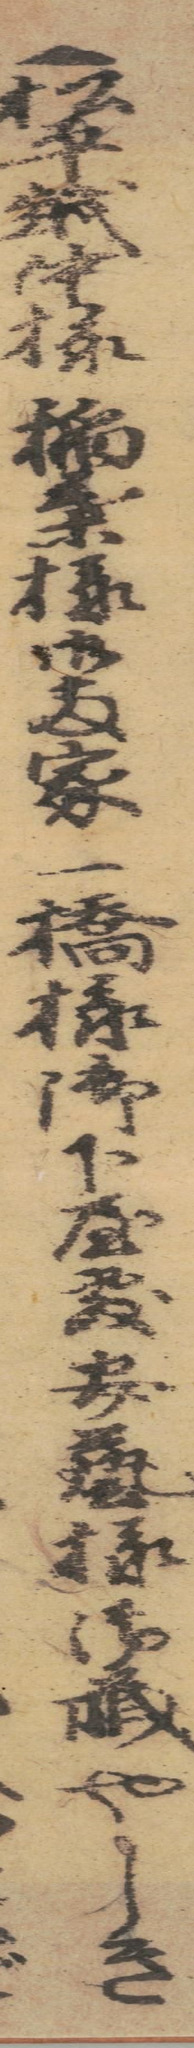▲松平越中様稲葉様御兩家一橋様御下屋敷安芸様御蔵やしき
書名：方角場所附
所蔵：東京大学地震研究所図書室 Earthquake Research Institute Library, The University of Tokyo, JAPAN
